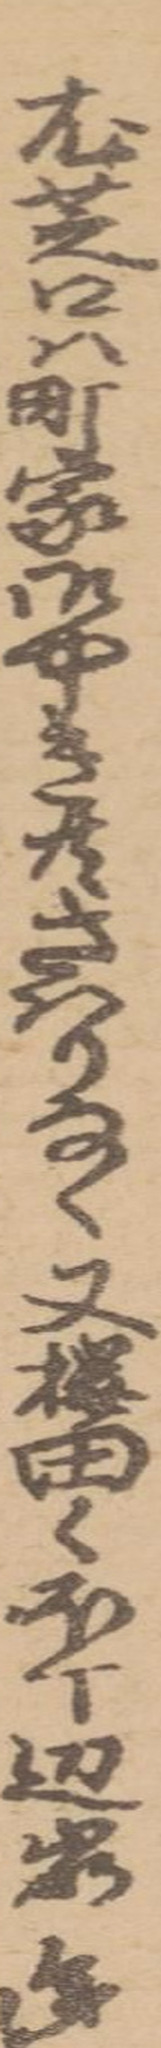尤芝口は町家御やしき共さはりなく又桜田くほ丁辺崩多し
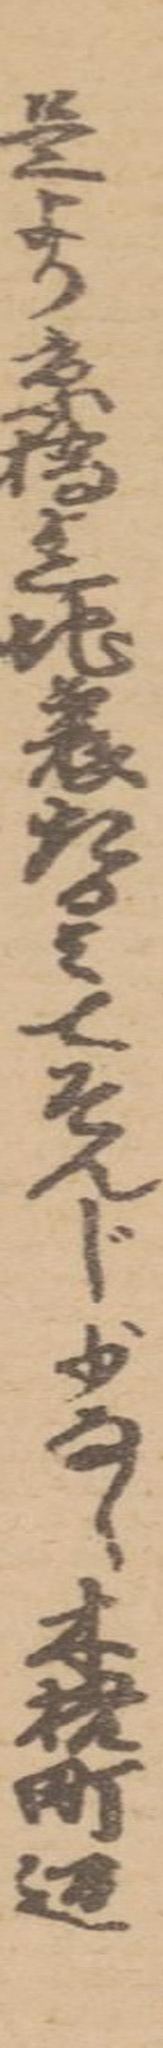是より京橋迄地表たるみてそんじ少なく木挽町辺
